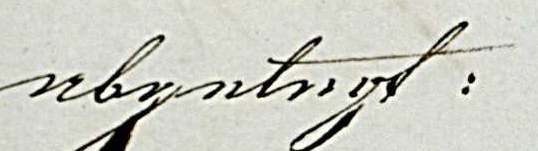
abgelegt:
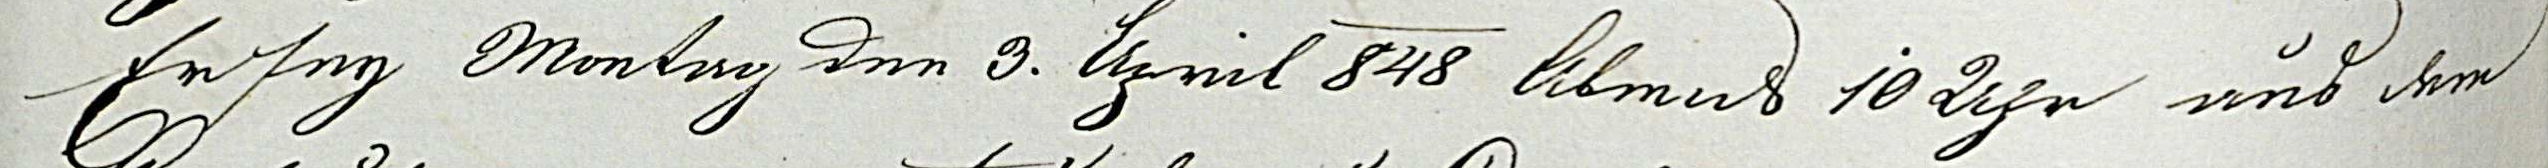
Er sey Montag den 3. April [1]848 Abends 10 Uhr aus dem
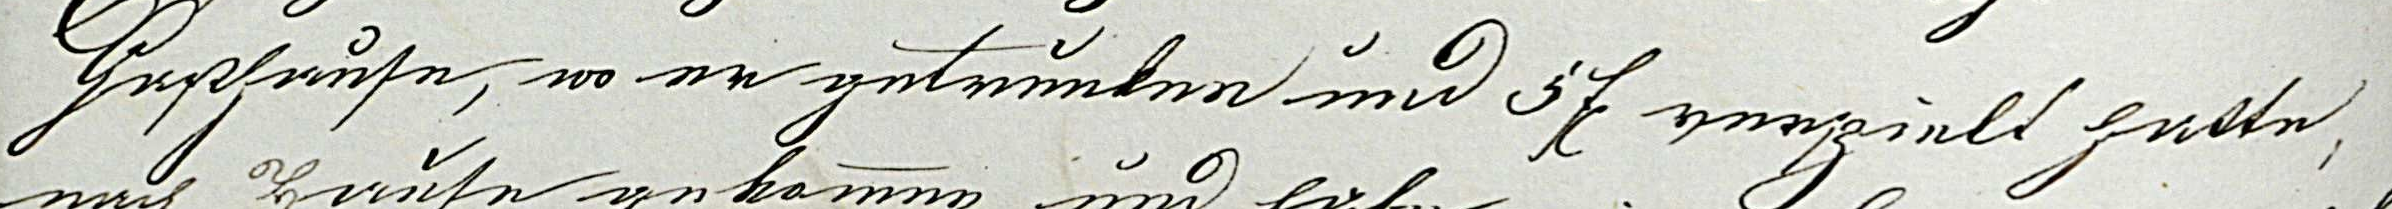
Gasthause, wo er getrunken und 5f verspielt hatte,
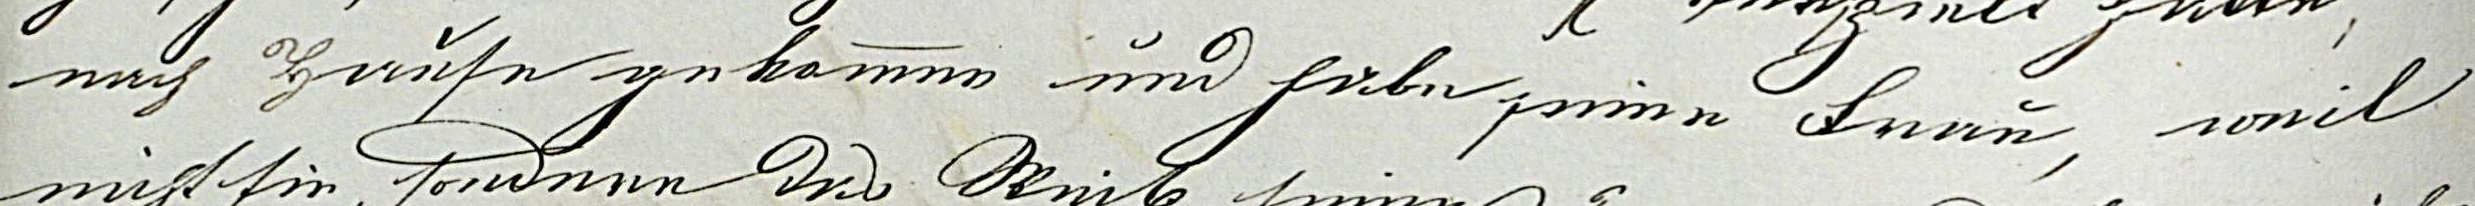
nach Hause gekommen und habe seine Frau, weil
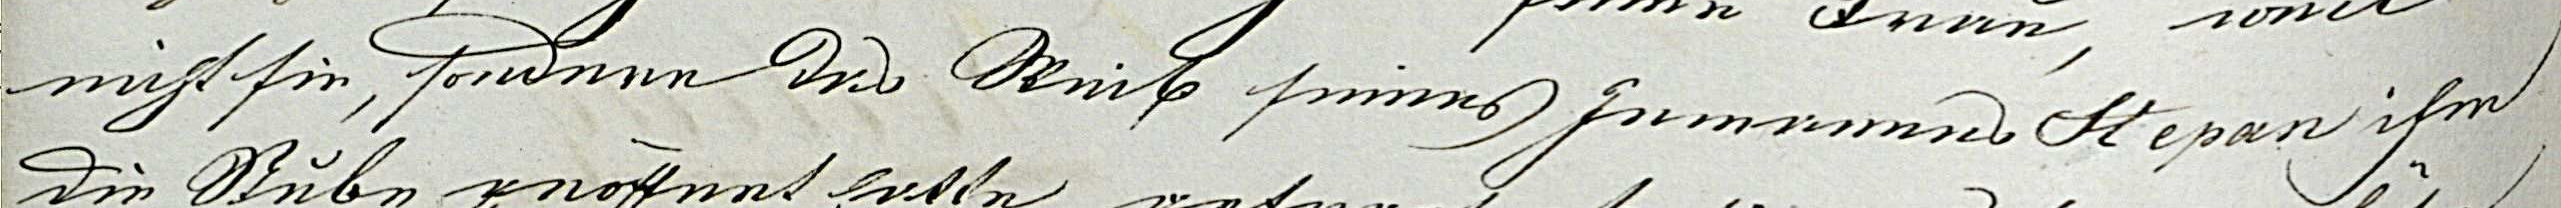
nicht sie, sondern das Weib seines Inmannes Stepan ihm
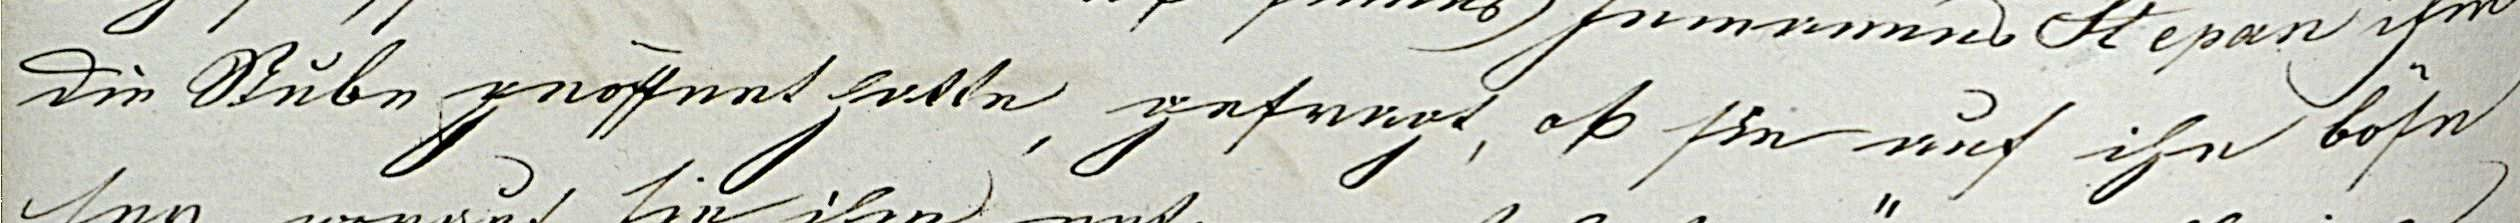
die Stube geöffnet hatte, gefragt, ob sie auf ihn böse
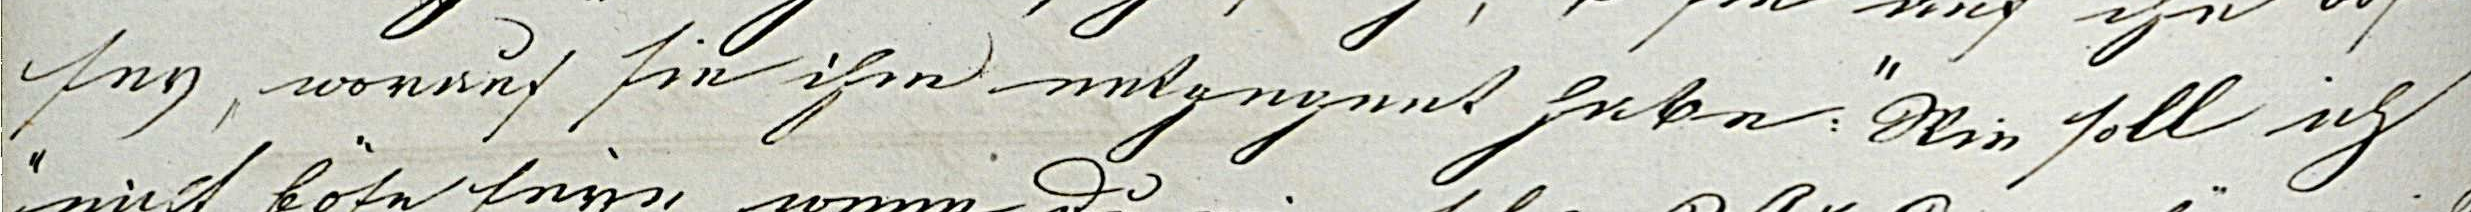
sey, worauf sie ihm entgegenet habe: „Wie soll ich
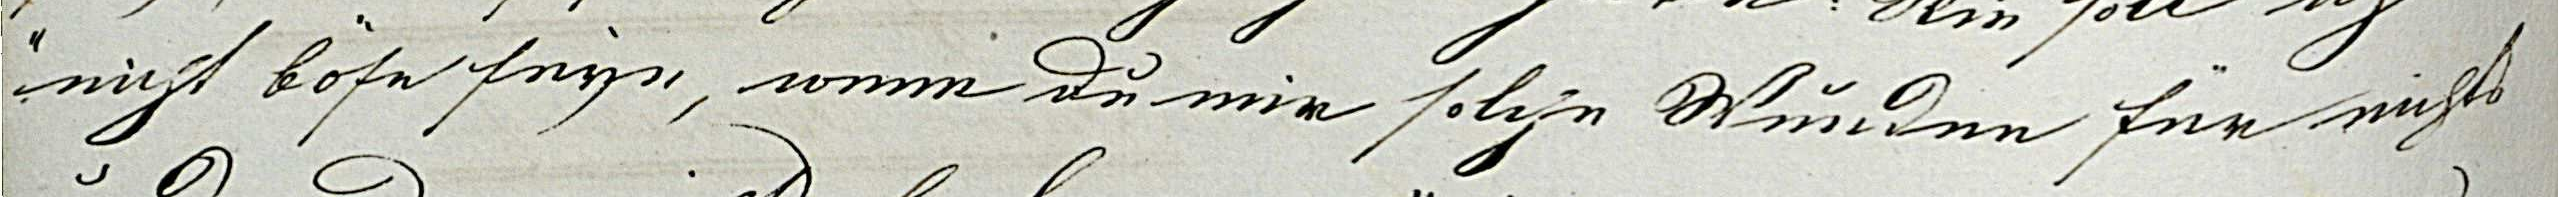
nicht böse seyn, wenn du mir solche Wunden für nichts
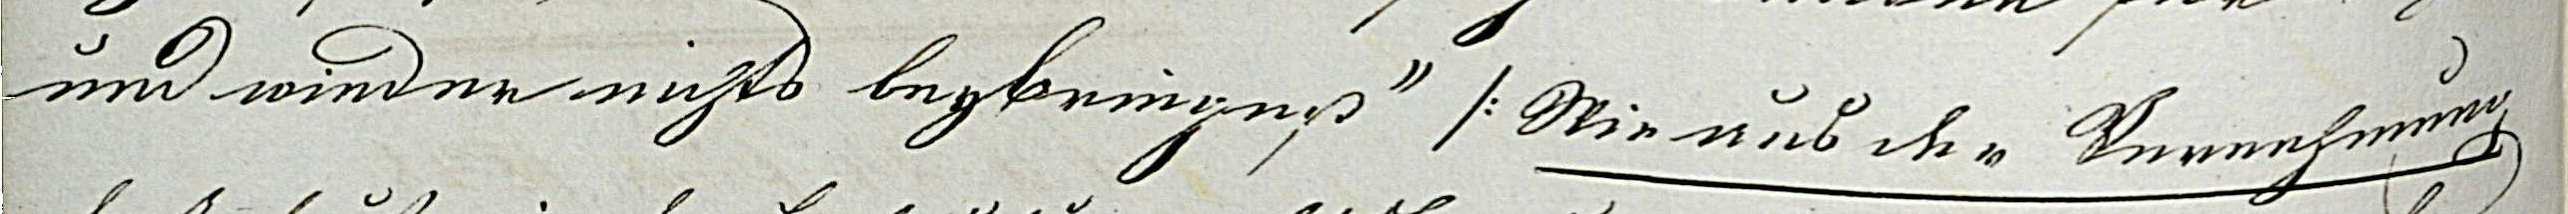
und wieder nichts beybringest“ (Wir aus der Vernehmung
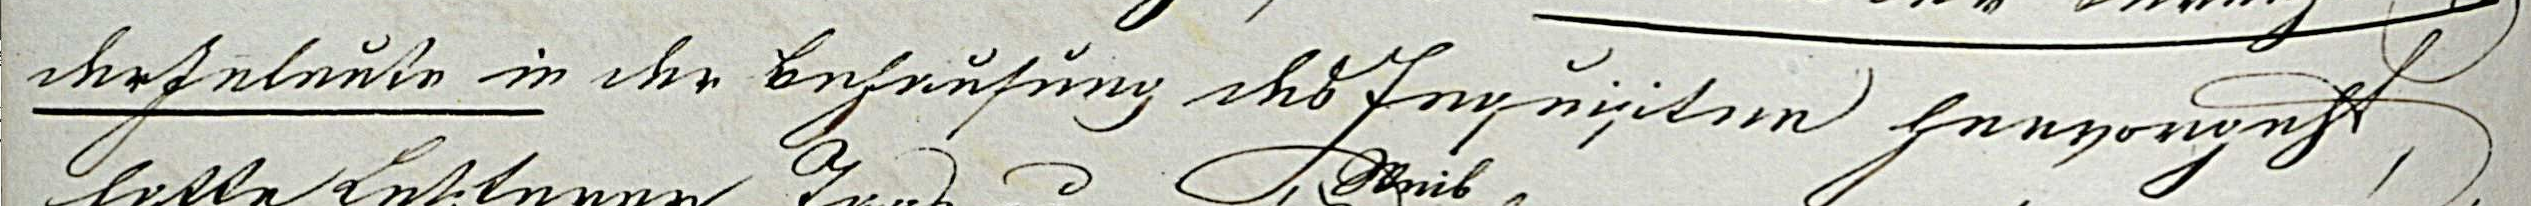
der Inleute in der Behausung des Inquisiten hervorgeht,
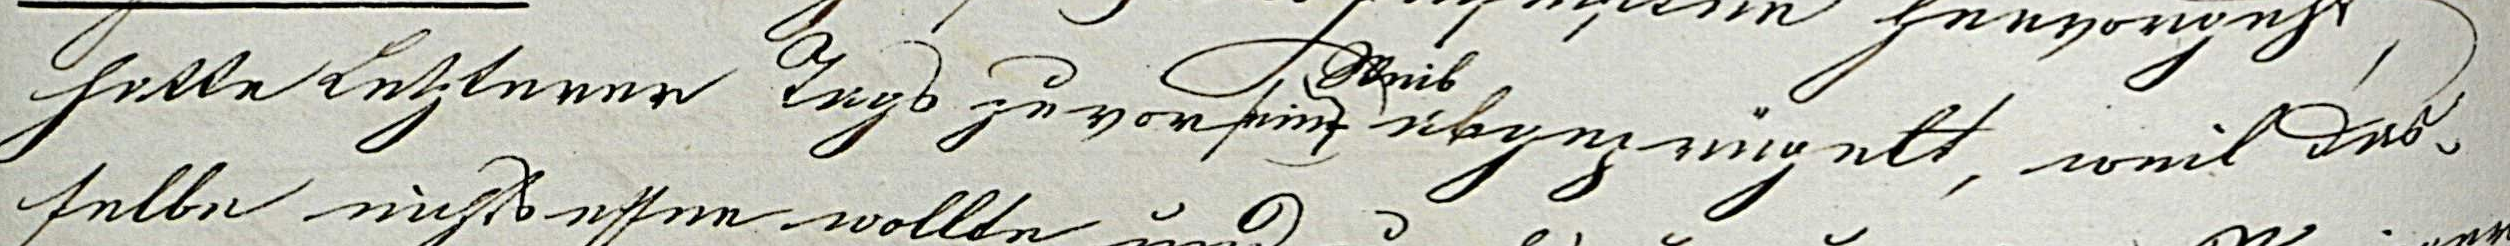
hatte Letzterer Tags zuvor sein Weib abgeprügelt, weil das¬
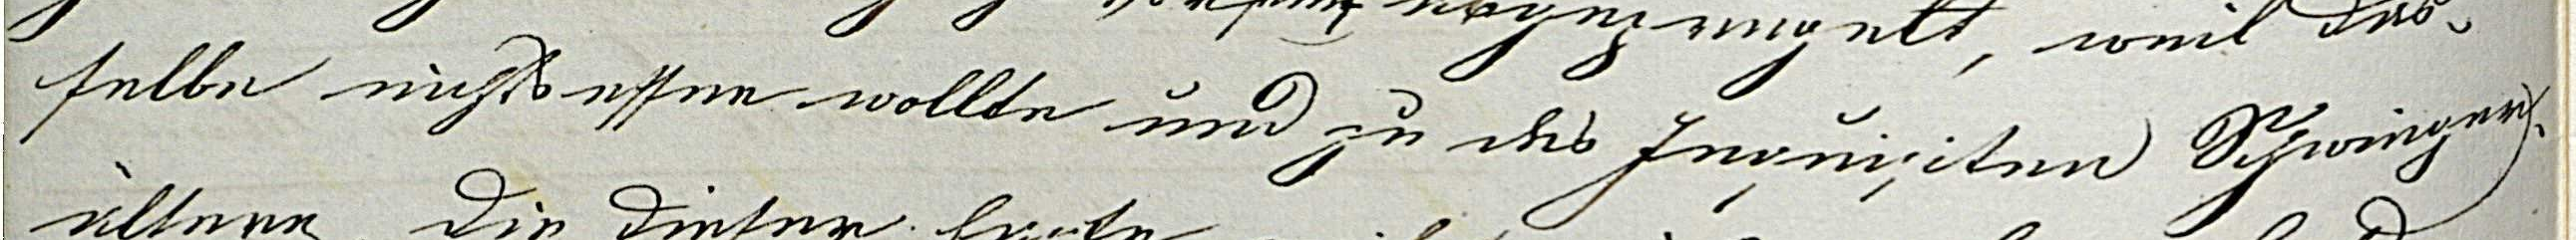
selbe nichts essen wollte und zu das Inquisiten Schwieger¬
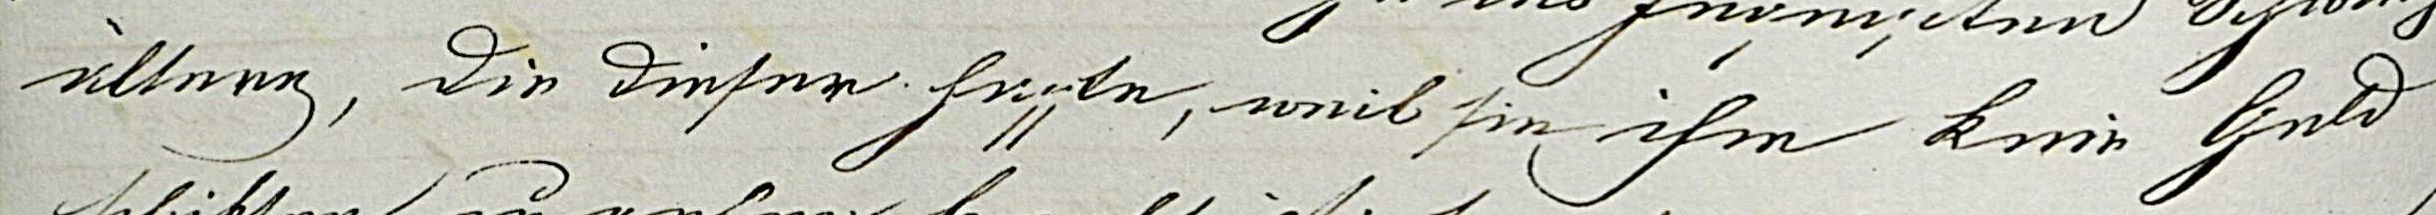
ältern, die dieser hasste, weil sie ihm kein Geld
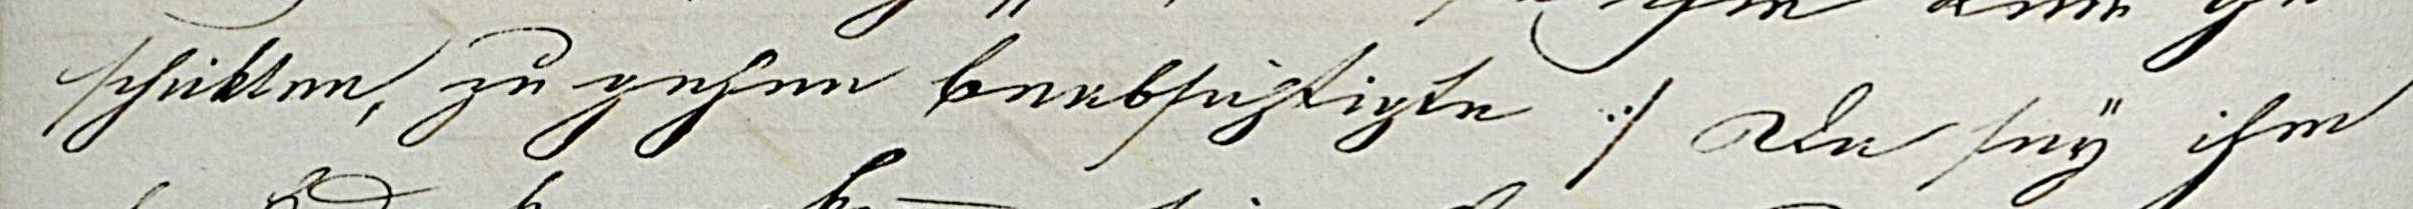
schikten, zu gehen beabsichtigte). Da sey ihm
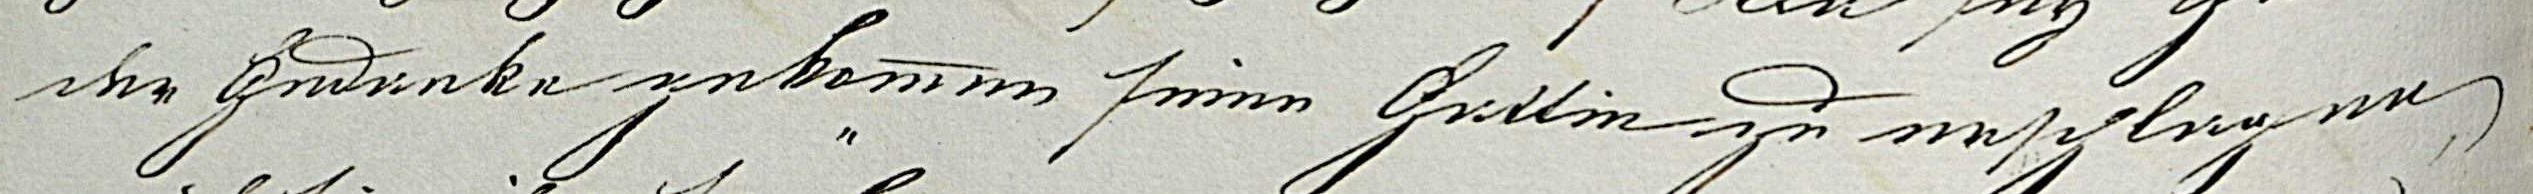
der Gedanke gekommen seine Gattin zu erschlagen
